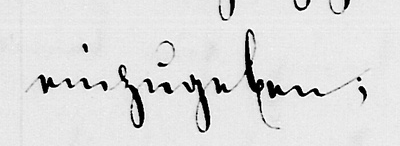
einzugeben;
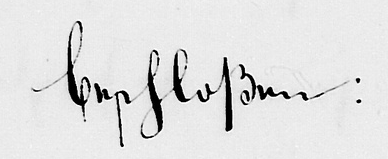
beschloßen:
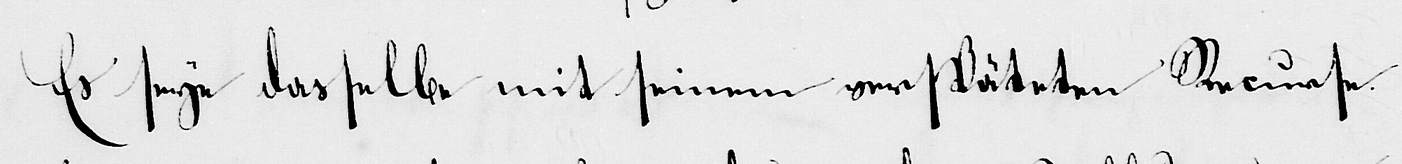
Es seye dasselbe mit seinem verspäteten Recurse
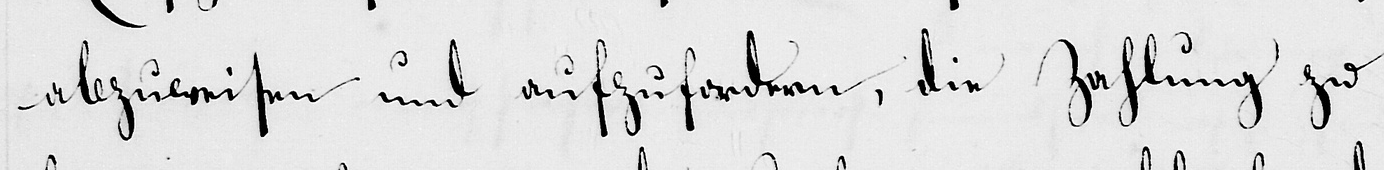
abzuweisen und aufzufordern, die Zahlung zu
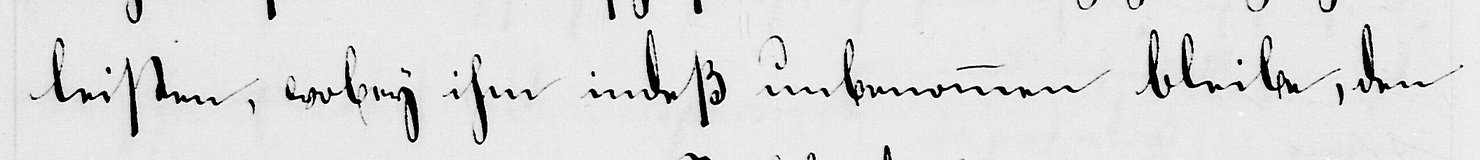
leisten, wobey ihm indeß unbenommen bleibe, den
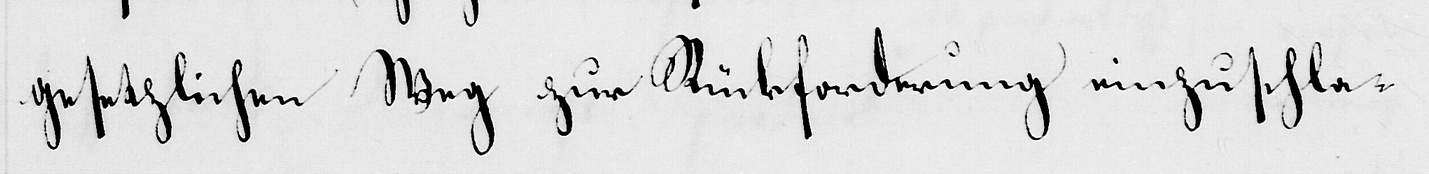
gesetzlichen Weg zur Rückforderung einzuschla¬
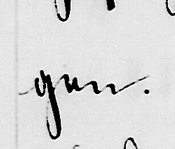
gen.
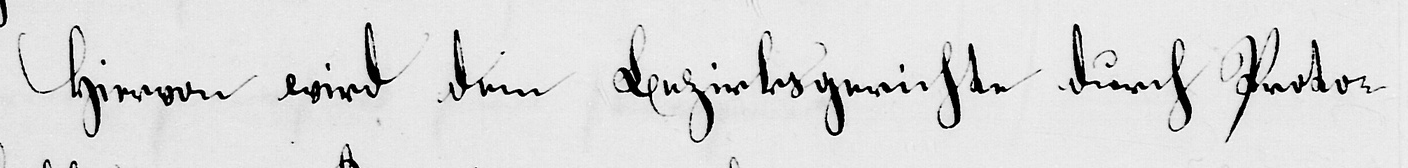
Hiervon wird dem Bezirksgerichte durch Proto¬
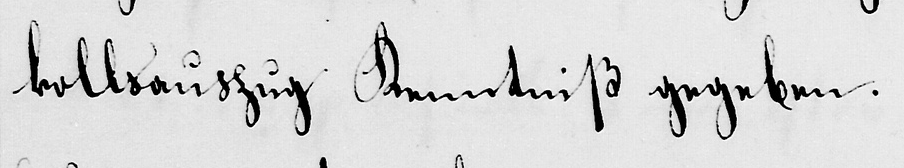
kollsauszug Kenntniß gegeben.
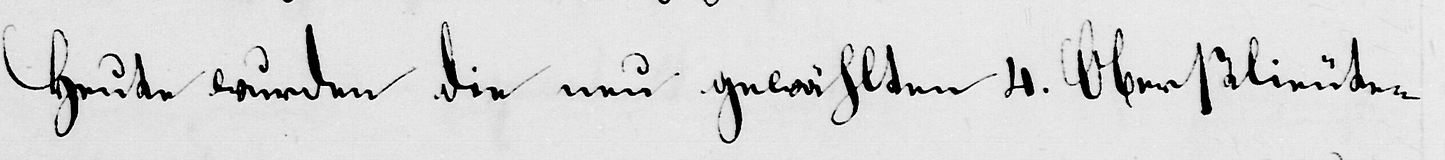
Heute wurden die neu gewählten 4. Oberstlieute-
